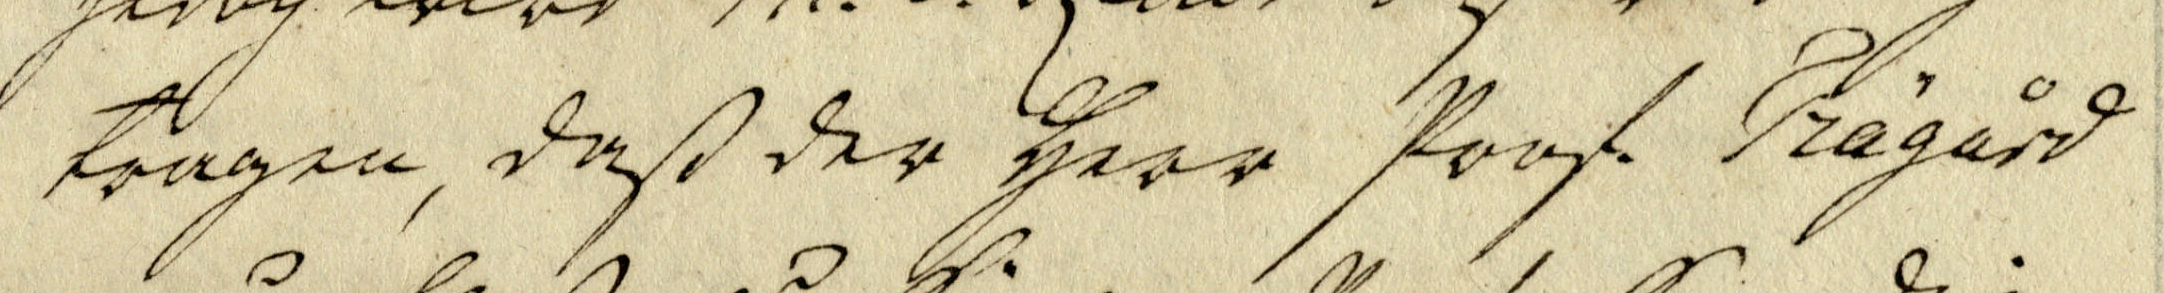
tragen, daß der Herr Prof. Trägård
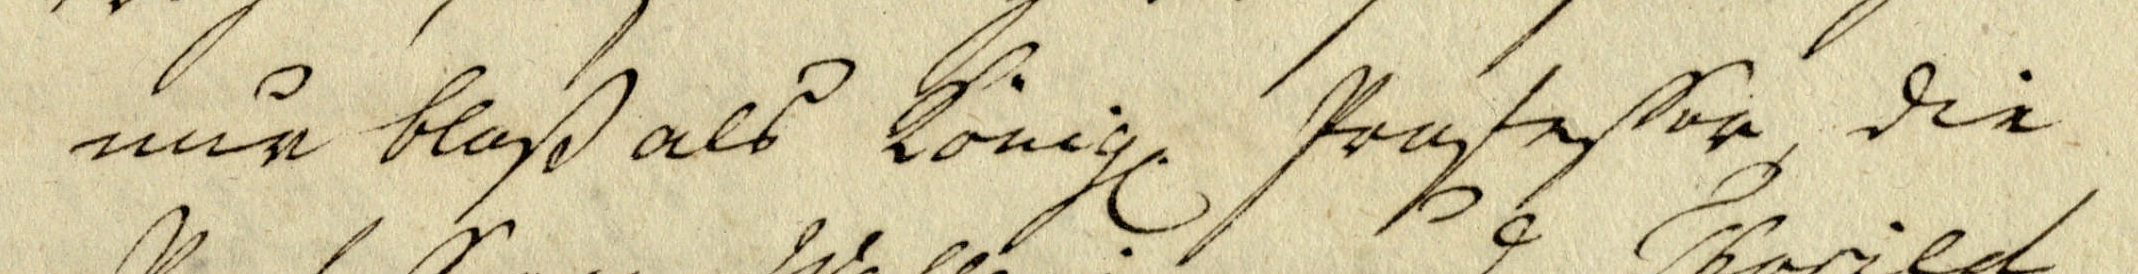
nun bloß als Königl. Professor, die
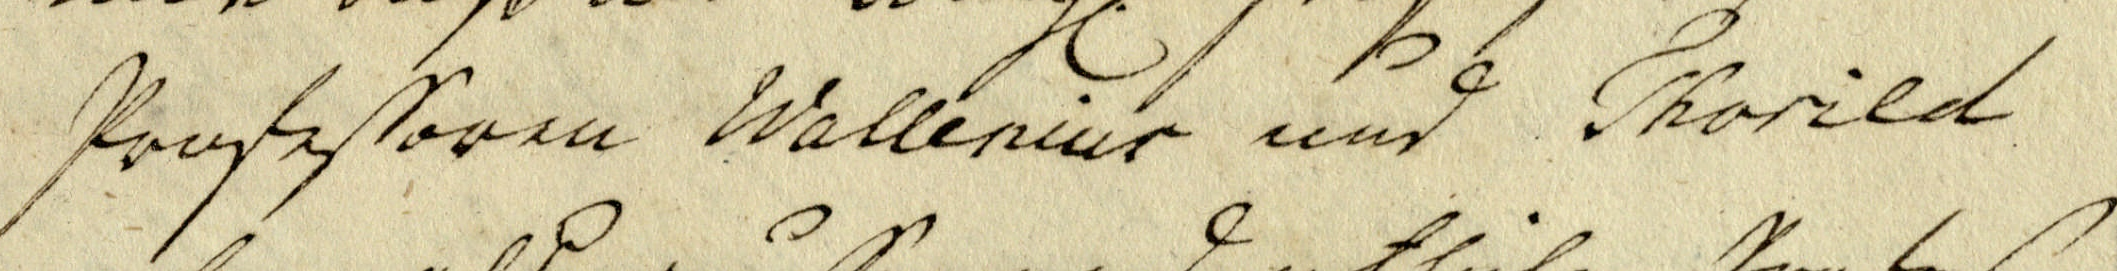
Professoren Wallenius und Thorild
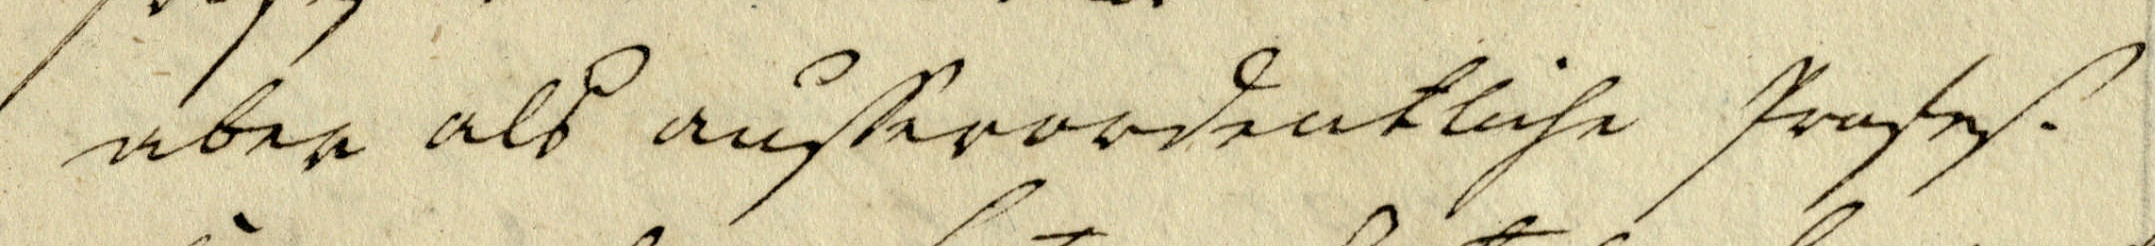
aber als ausserordentliche Profes¬
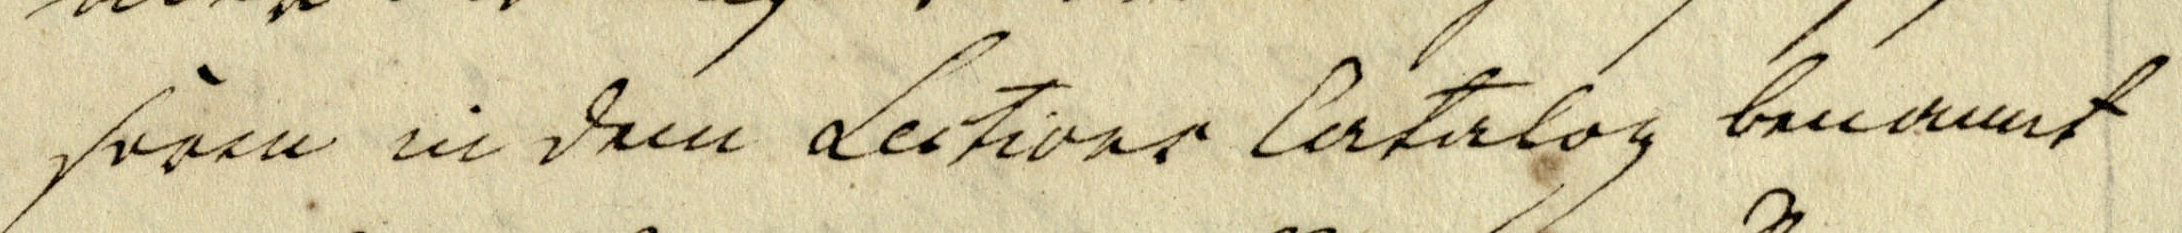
soren in dem Lections Catalog benannt
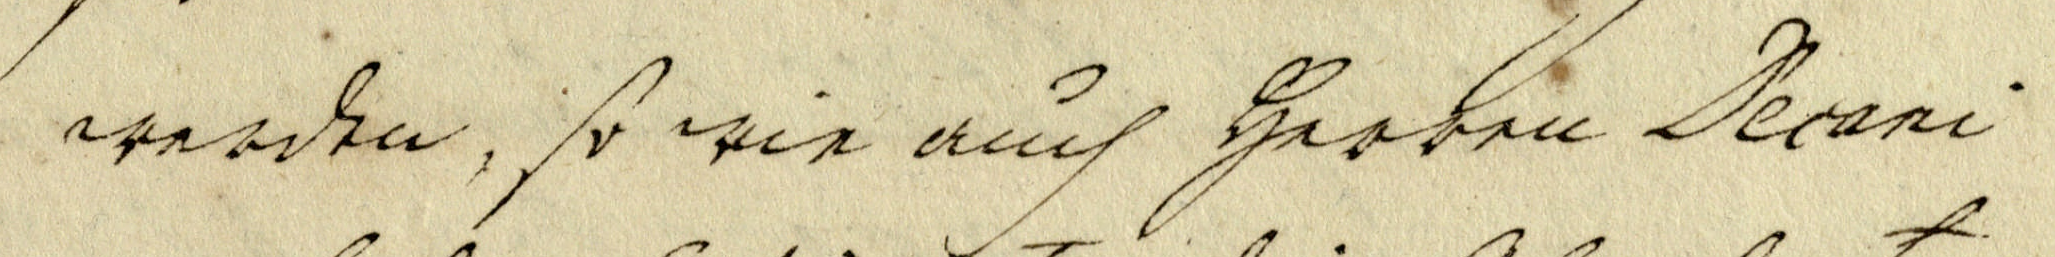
werden, so wie auch Herren Decani
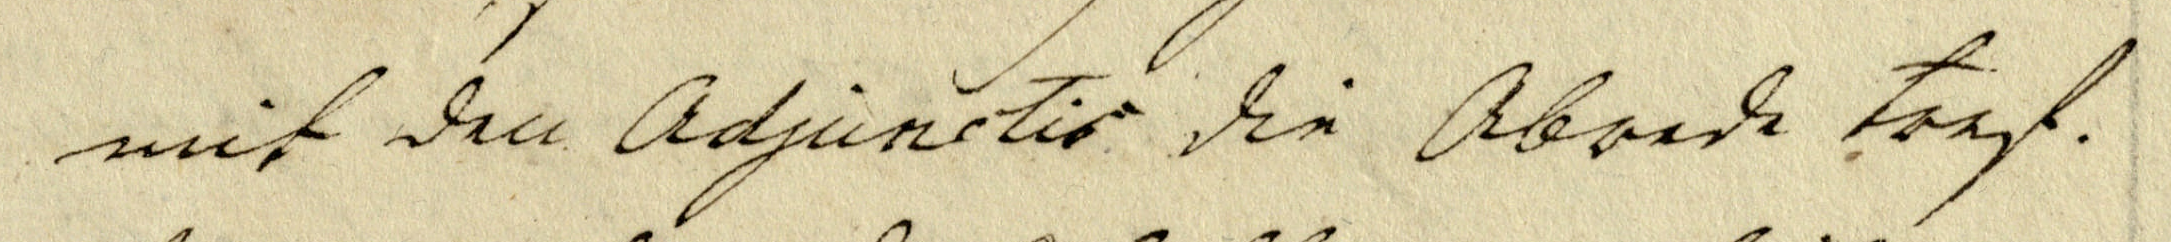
mit den Adjunctis die Abrede tref¬
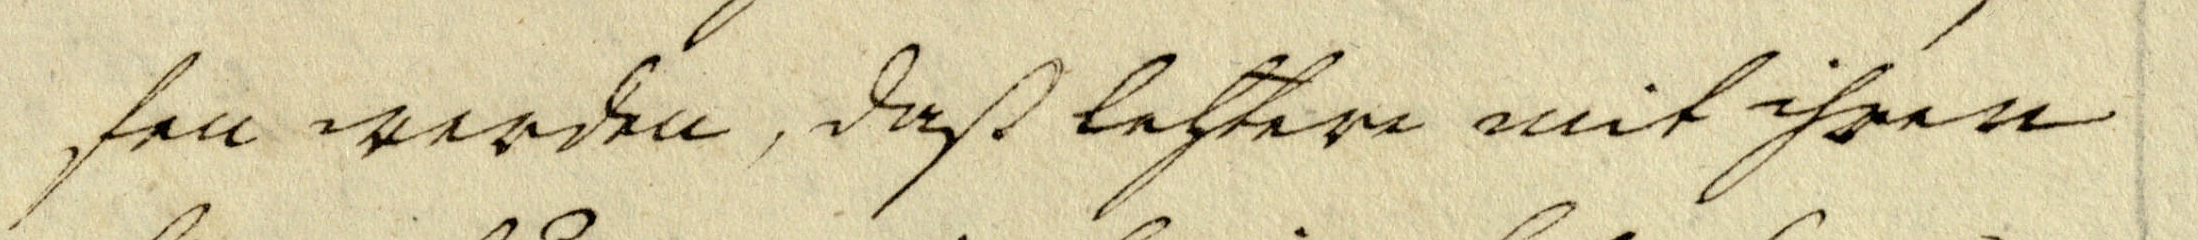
fen werden, daß letztere mit ihren
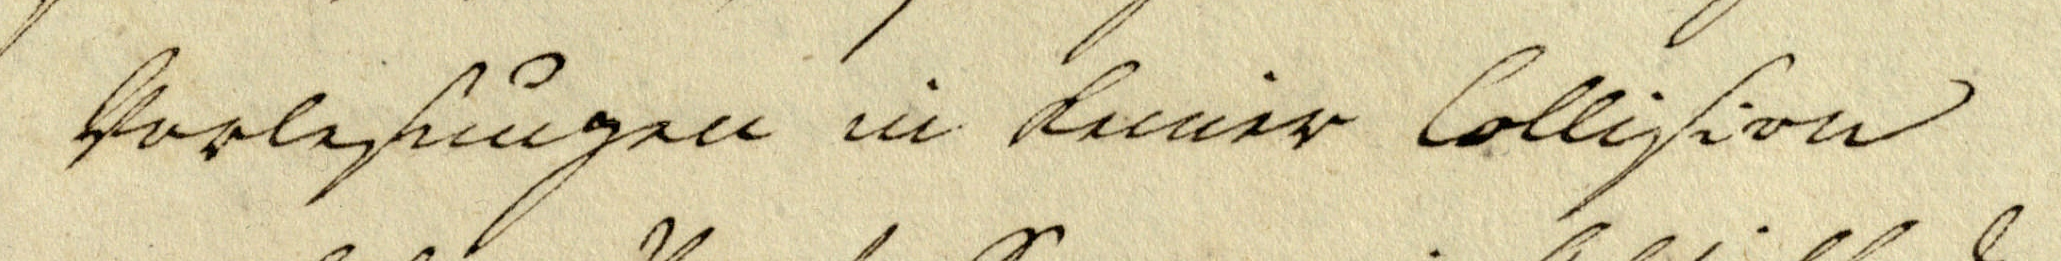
Vorlesungen in keiner Collision
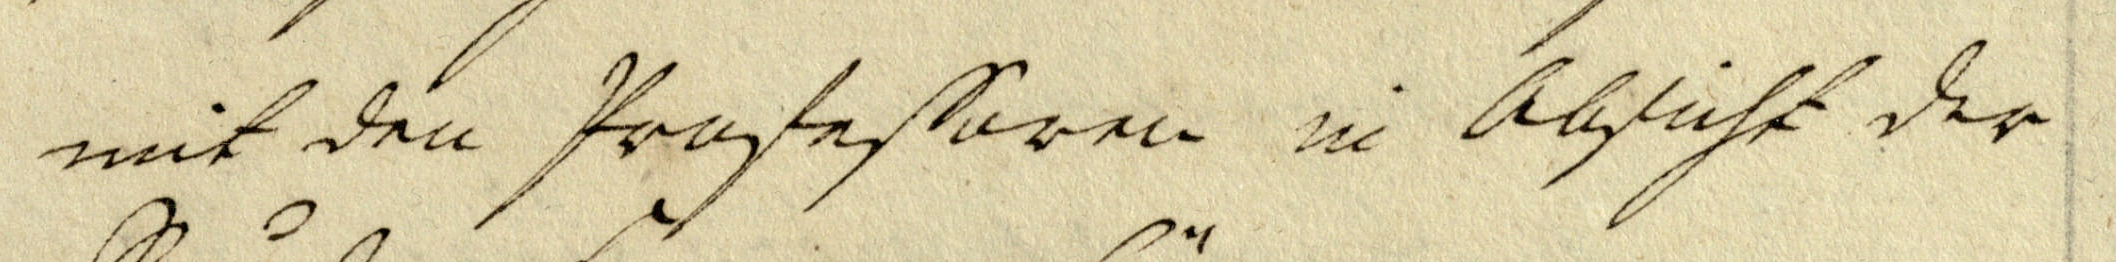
mit den Professoren in Absicht der
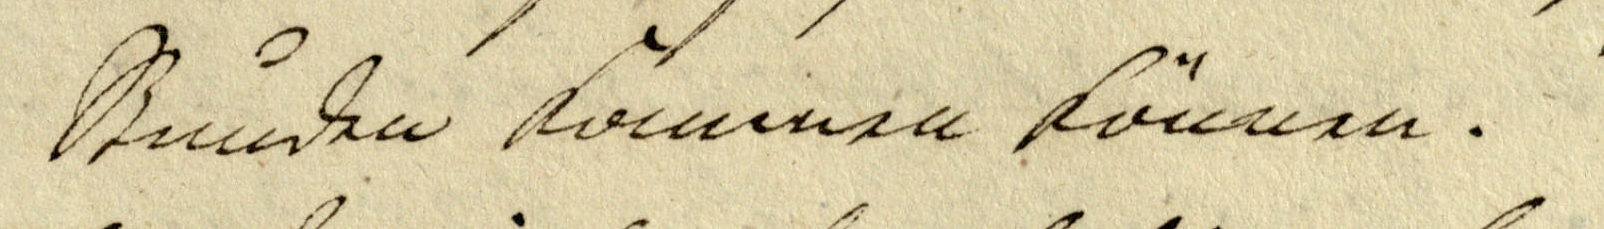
Stunden kommen können.
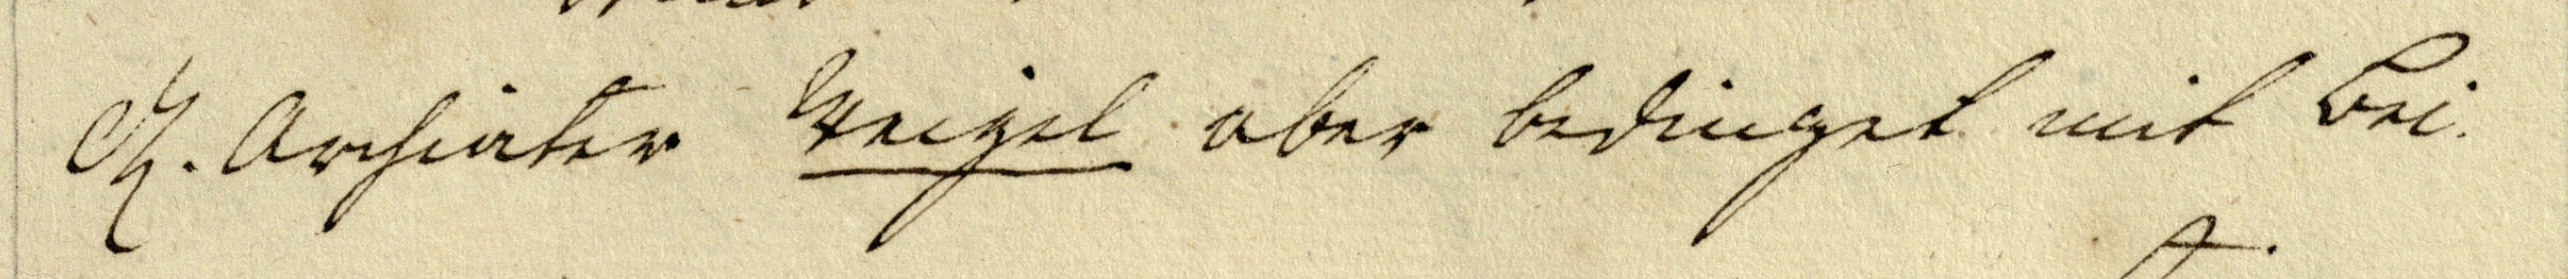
dh. Archiater Weigel aber bedinget mit Bei¬
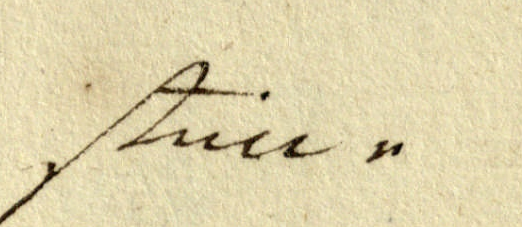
stim¬
